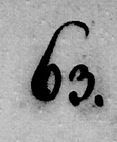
rbei¬
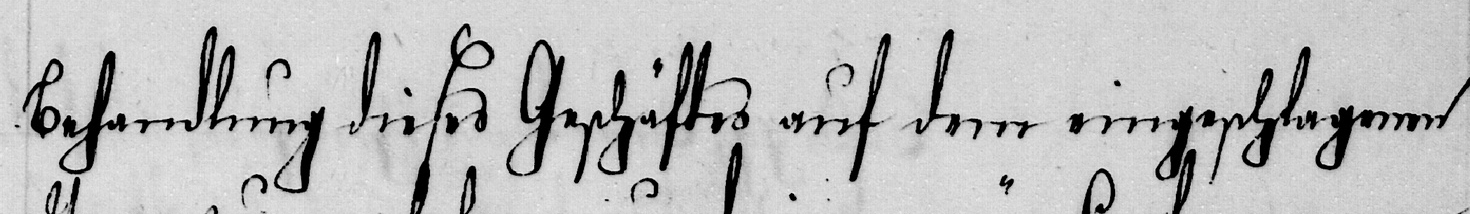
Behandlung dieses Geschäfts auf dem eingeschlagenen
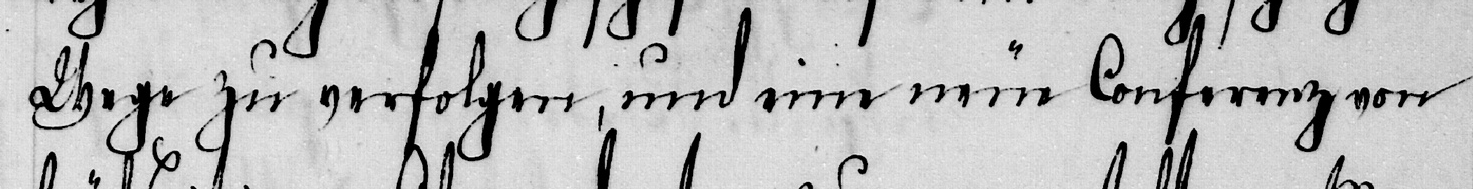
Wege zu verfolgen, und eine neue Conferenz von
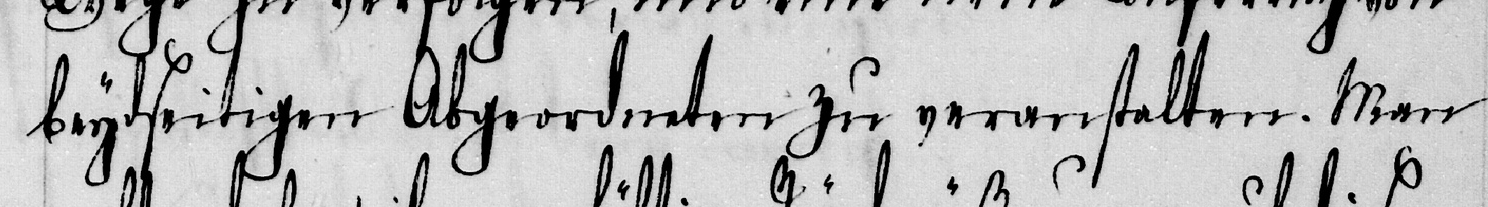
beydseitigen Abgeordneten zu veranstalten. Man
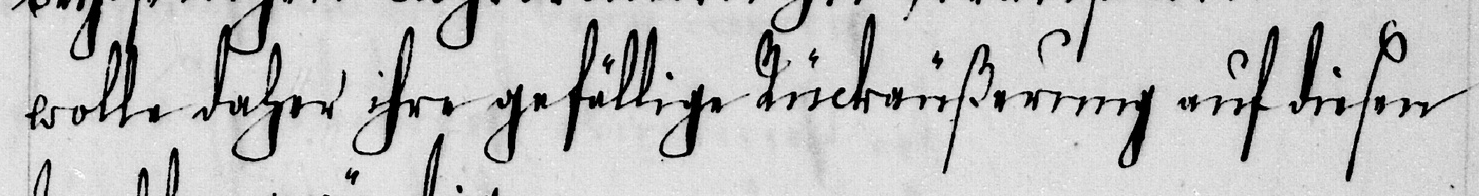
wolle daher ihre gefällige Rückäußerung auf diesen
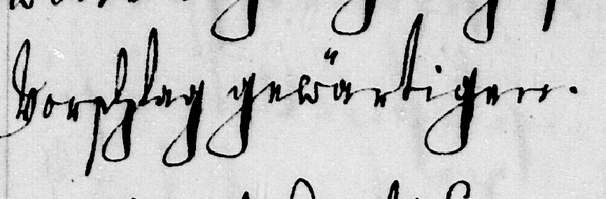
Vorschlag gewärtigen.
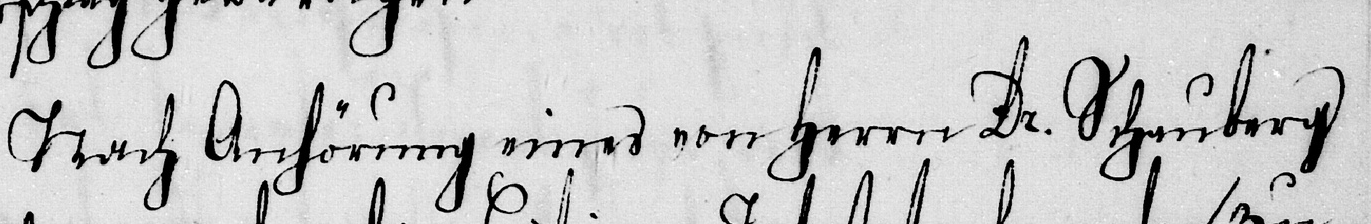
Nach Anhörung eines von Herrn Dr. Schauberg
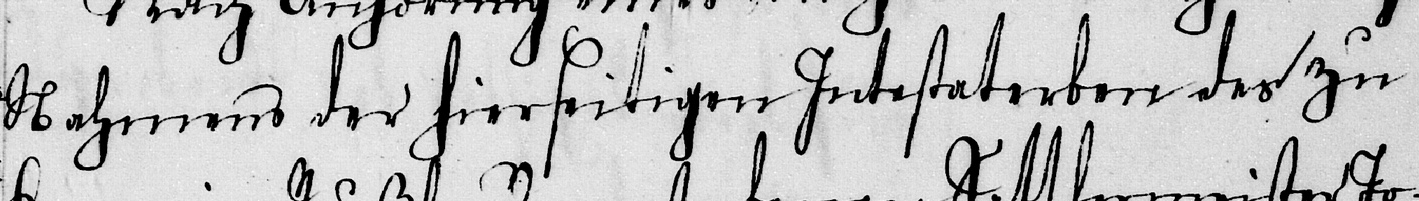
Nahmens der hierseitigen Intestaterben des zu
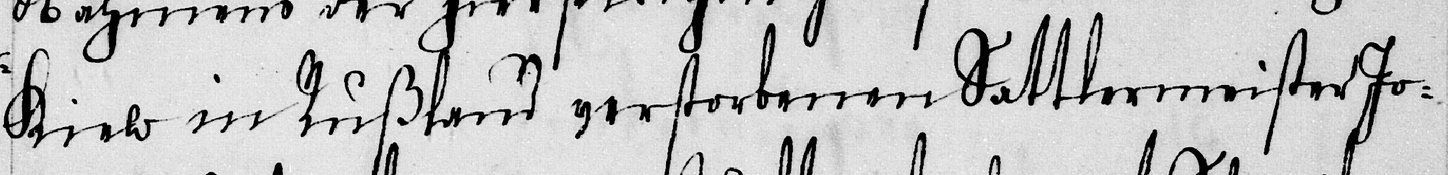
Kiew in Rußland verstorbenen Sattlermeister Jo¬
